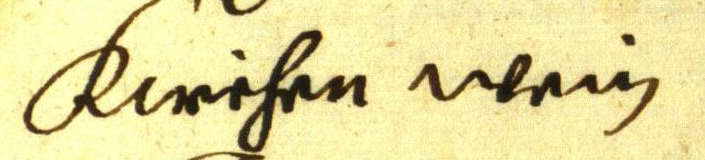Kirchen Wein
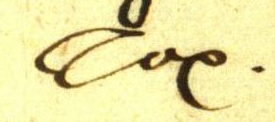Tax.
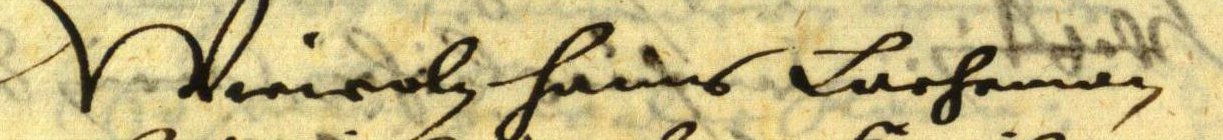Wiewoln hanns Locheman
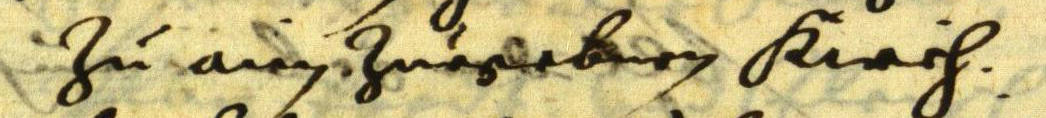Zū aim Zūegeben Kirch¬
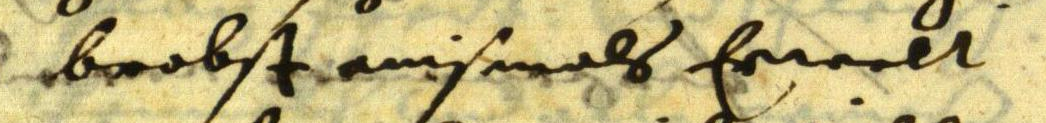brobst ainsmals Erwelt
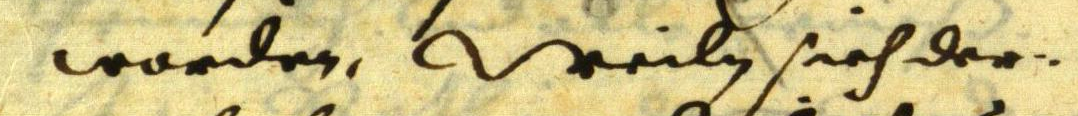worden. Weiln sich der¬
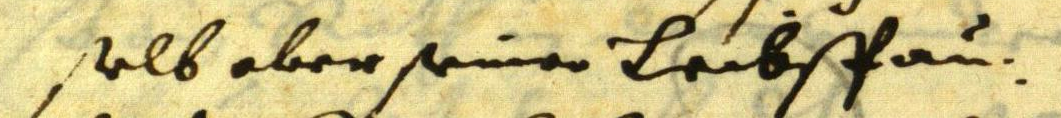selb aber seiner LeibsPaū¬
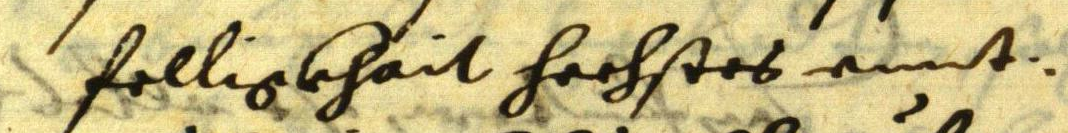felligkhait hechstes ennt¬
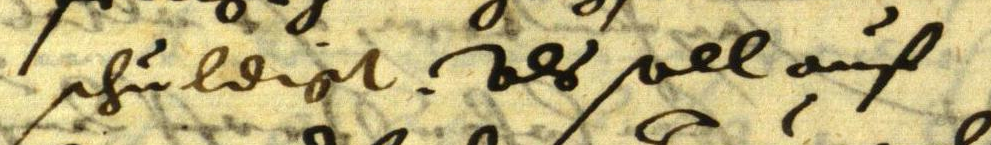schūldigt. Als soll aūf
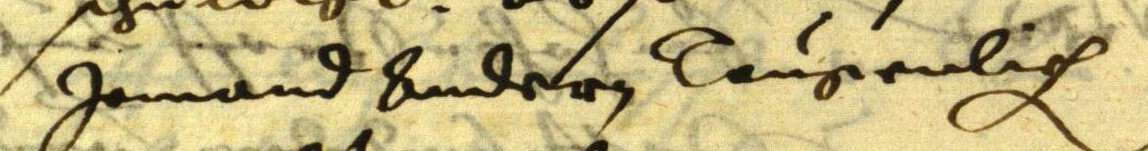Jemand Andern Taūgenlich
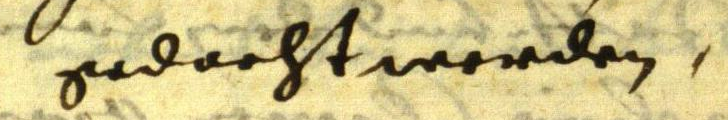gedacht werden,
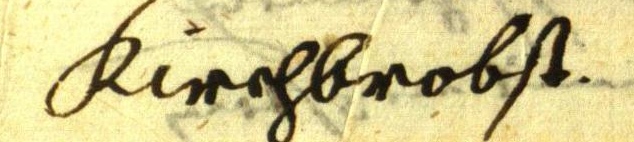Kirchbrobst.
